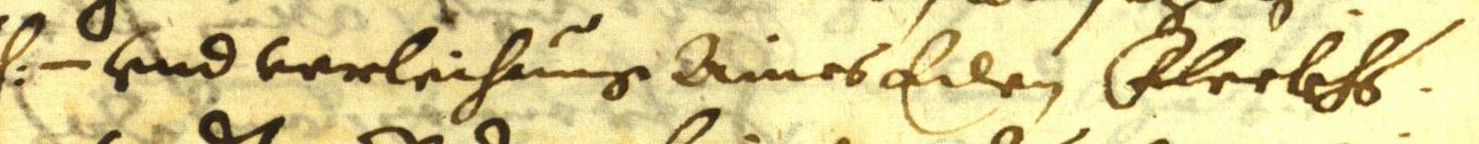— vnd verleichūng Aines Edlen Fleckhs.
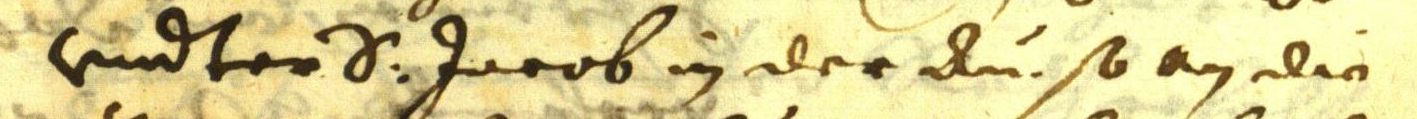vndter S Jacob in der Aū. so an die
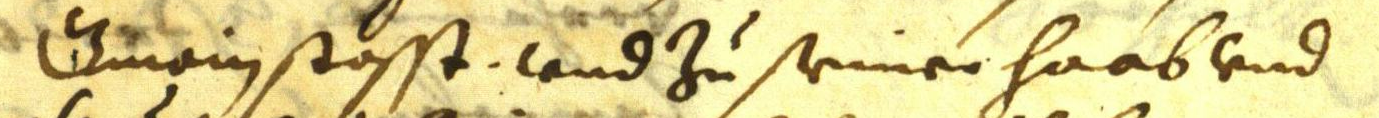Gmain stosst. vnd Zū seiner haab vnd
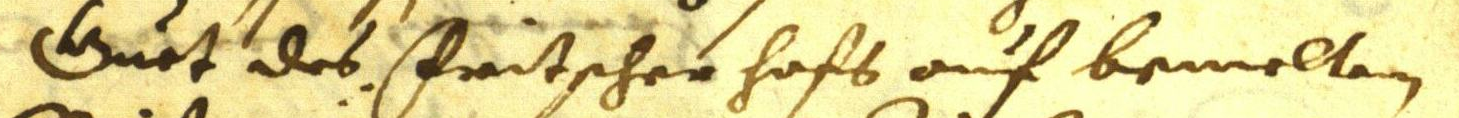Gūet des Fritscher hofs aūf bemeltem
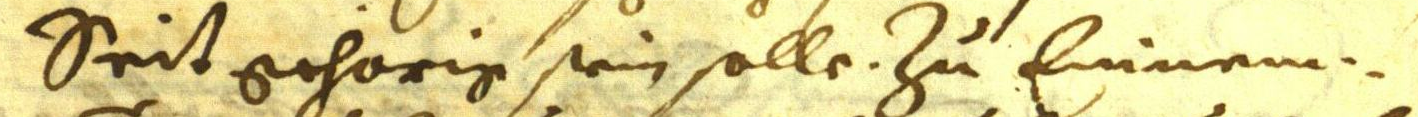Seit gehörig sein solle. Zū Einnem¬
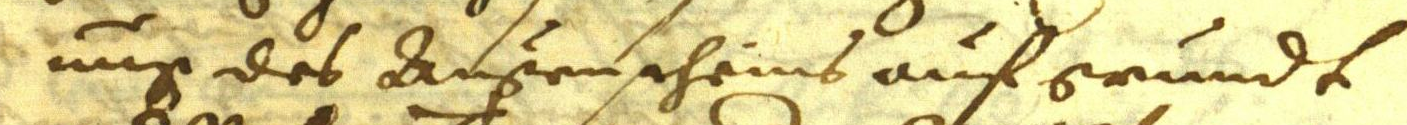ūng des Aūgenscheins aūf grūndt
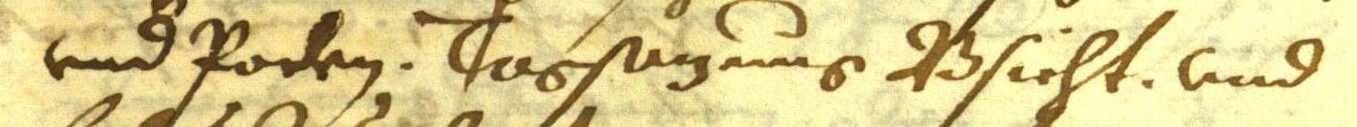vnd Poden. Tagsatzūng Bsicht. vnd
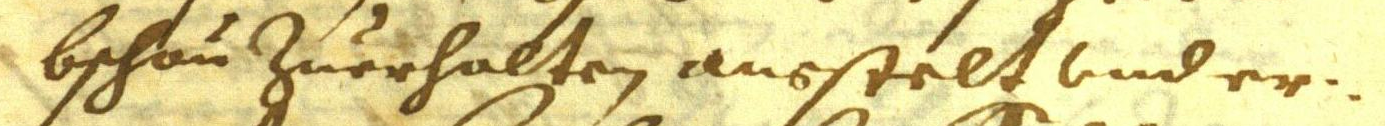bschaū Zūerhalten anstelt vnd er¬
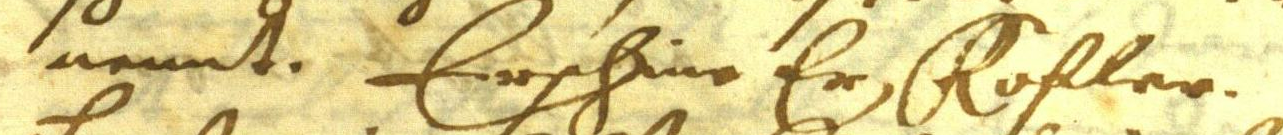nennt. Erscheine Er Kofler.
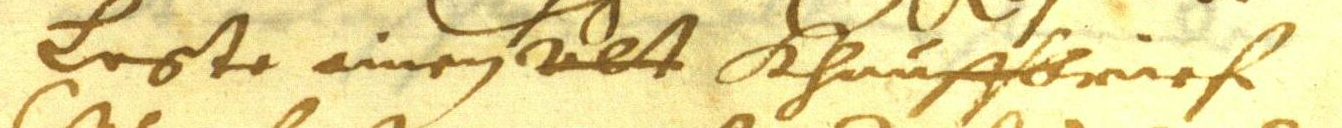Legte ainen alt Khaūffbrief
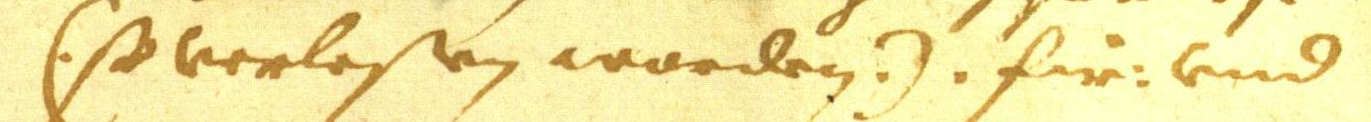(.so verlesen worden.). fir: vnd
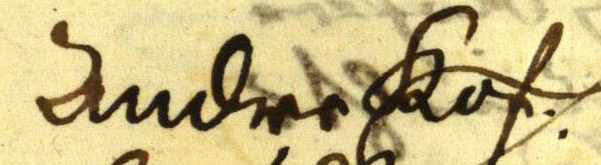Andre Kof¬
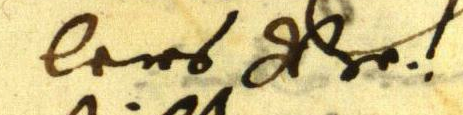lers Be¬
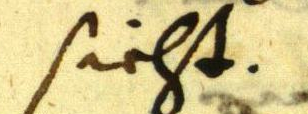sicht.
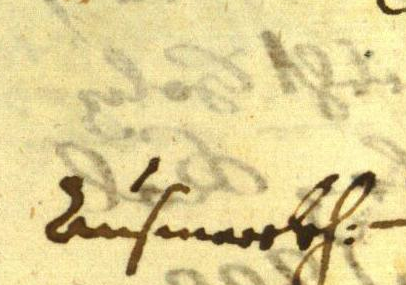Ausmarckh:
